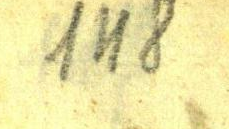148
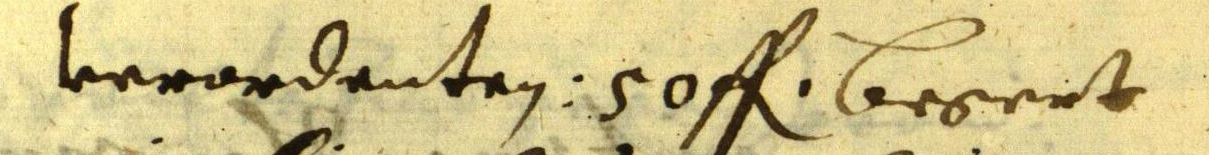verordenten: 50 fl. begert
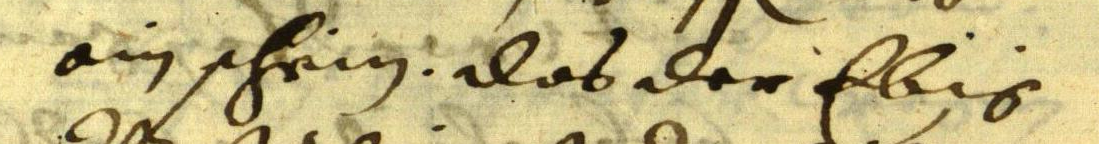ain schein. das der Ebig
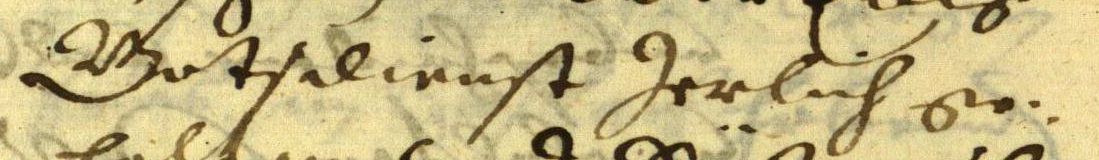Gotsdienst Jerlich ge¬
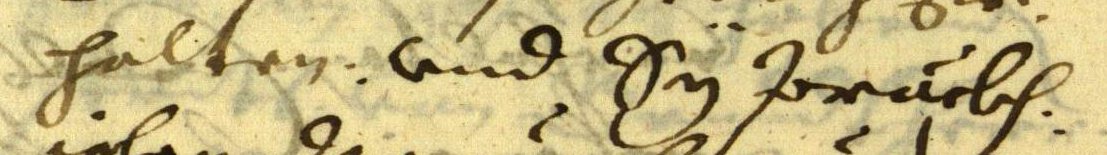halten: vnd Sÿ Prāckh¬
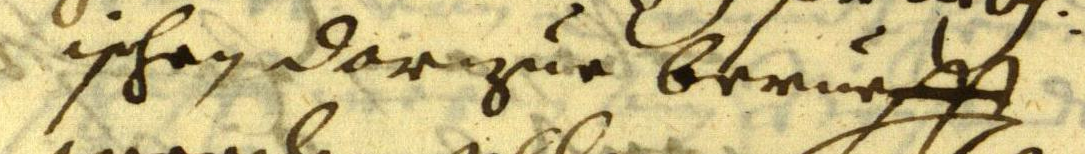ischen dar zūe berūefft
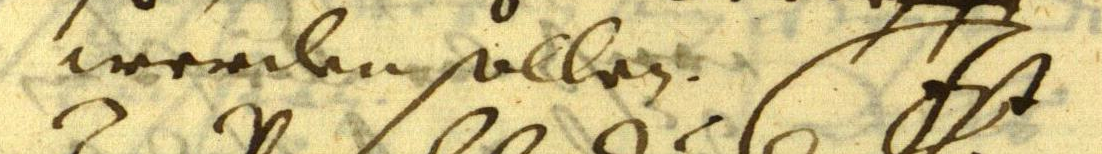werden sollen. Ist
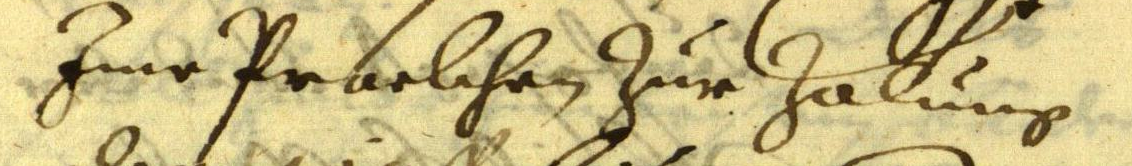Ime Prackhen Zūr Zalūng
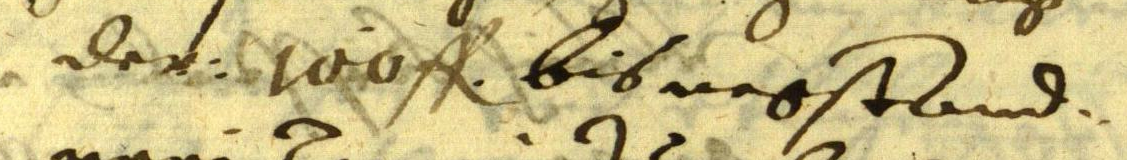der: 100 fl. bis negst And¬
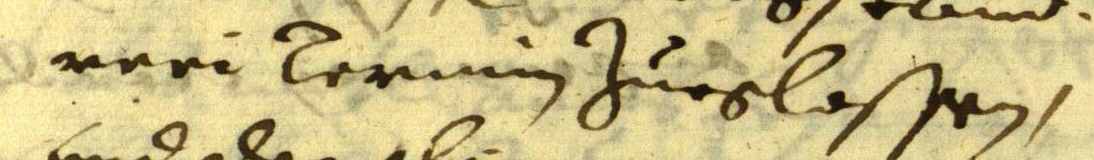reei Termin Zūeglassen,
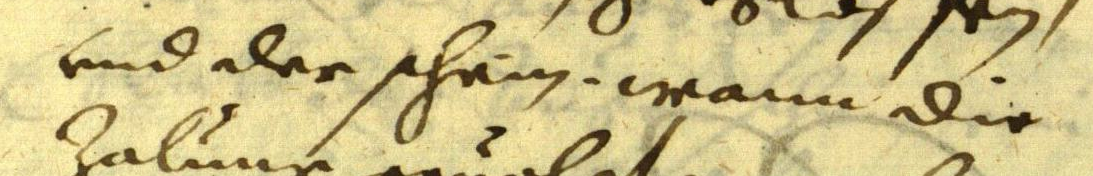vnd der schein. wann die
